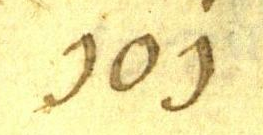101
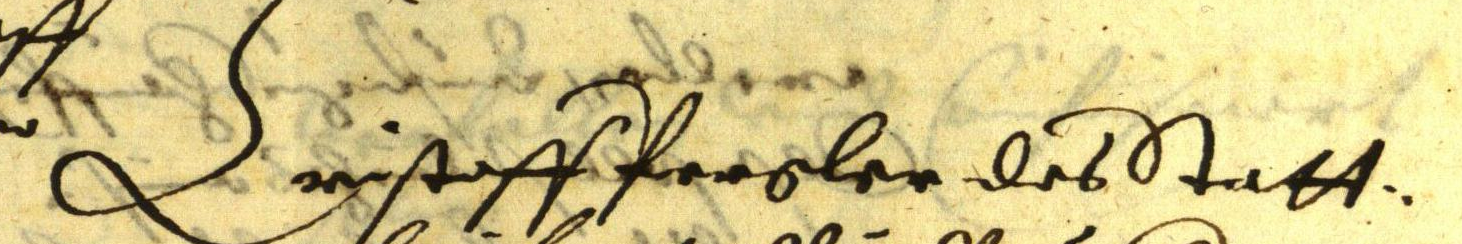Cristoff Pergler des Statt¬
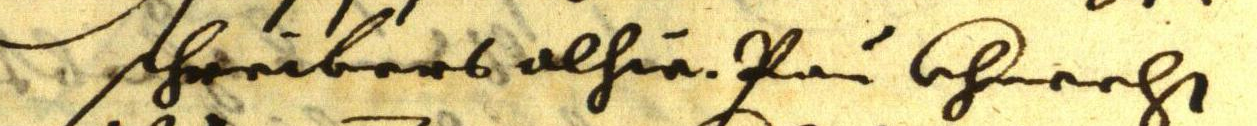schreibers alhie. Paū khnecht
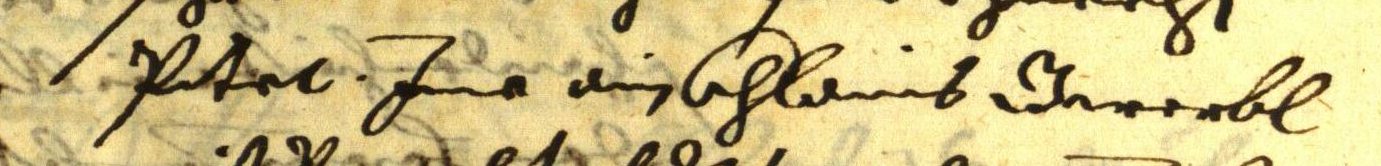Pitet. Ime ain khlains Gwerbl
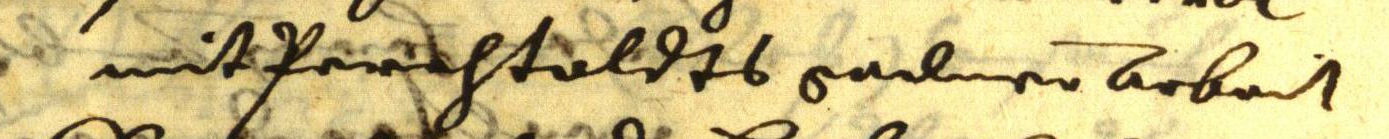mit Perchtoldts gadner Arbait
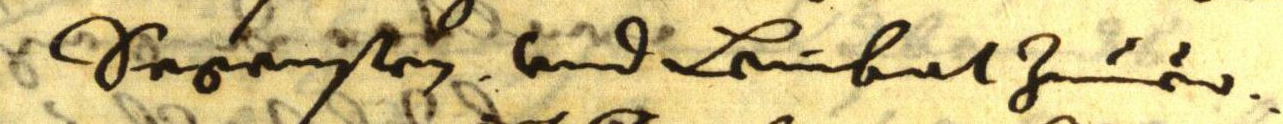Segensen. vnd Leinbat Zūūer¬
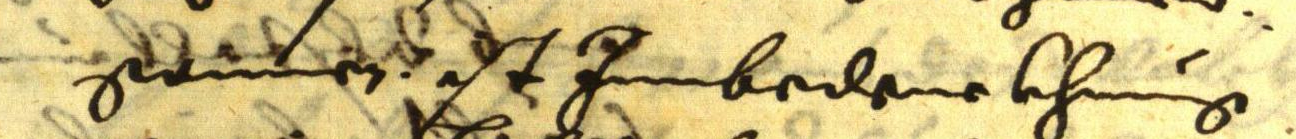gonnen. ist Innbedenckhūng
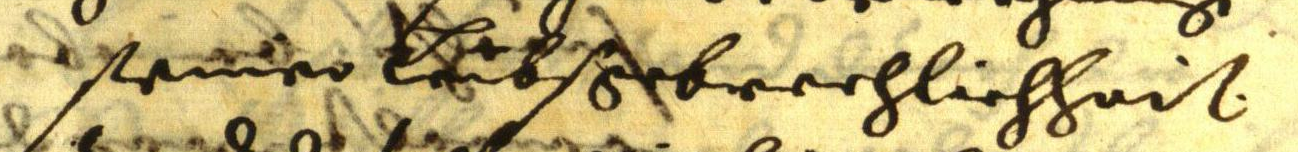seiner Leibsgebrechlichhait
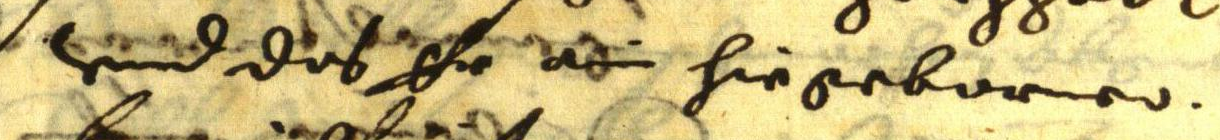vnd das Er ain hie geborner.
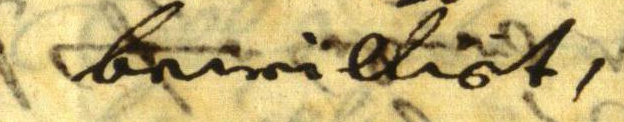bewilligt,
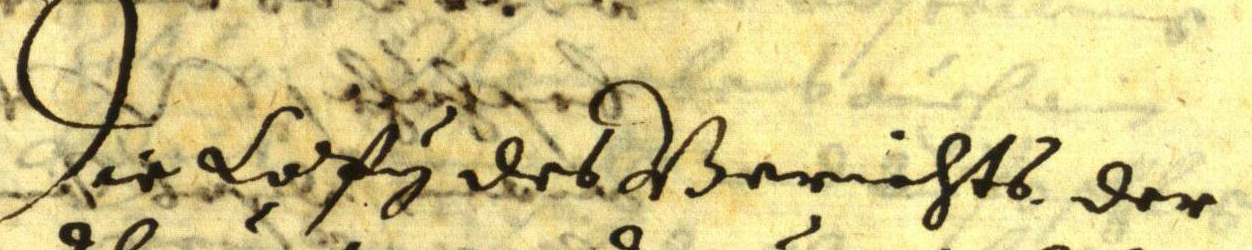Die CoPȳ des Berichts. der
